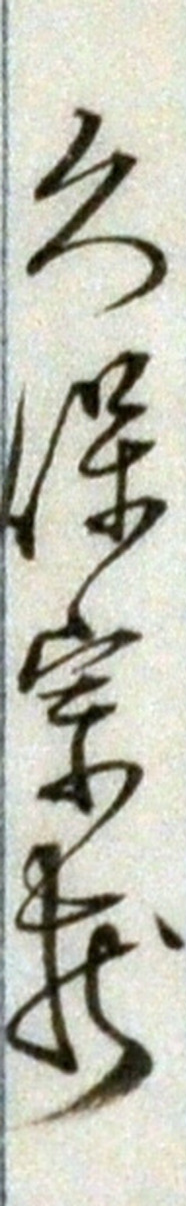久保宗蔵
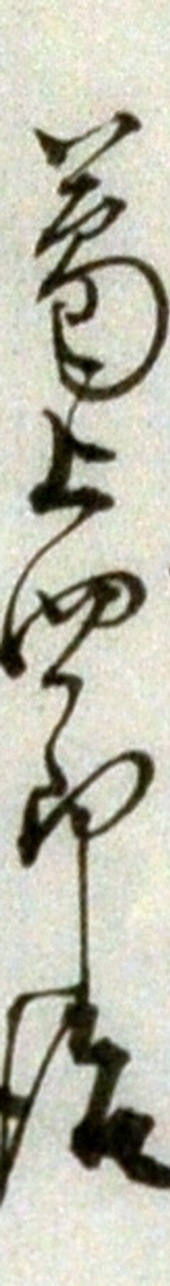葛上四郎治
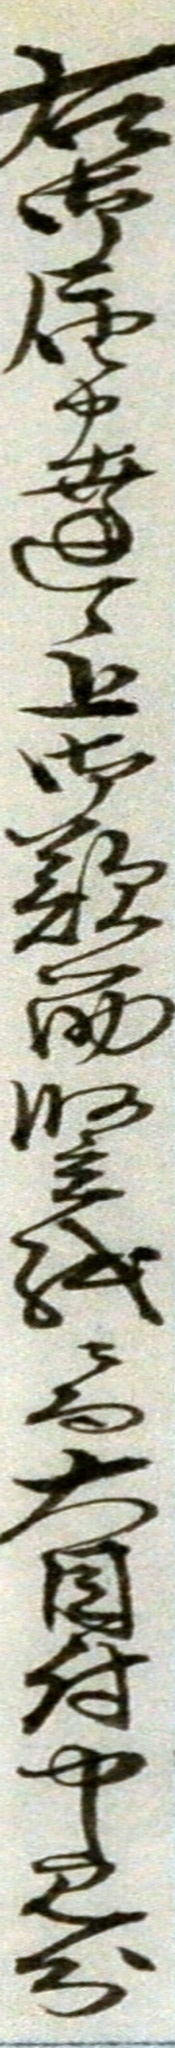右御届申達候上御歎筋竪紙ニ而大目付中見分
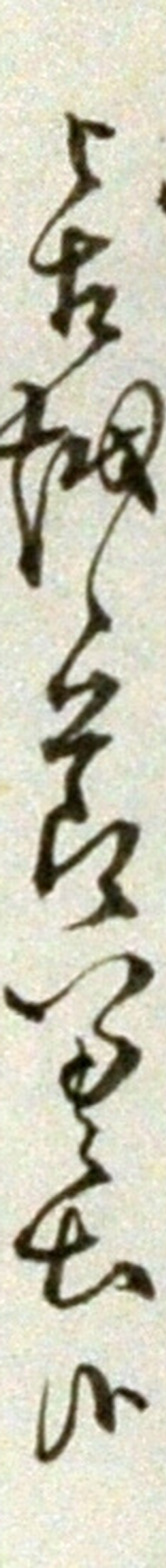被相越候節差出候
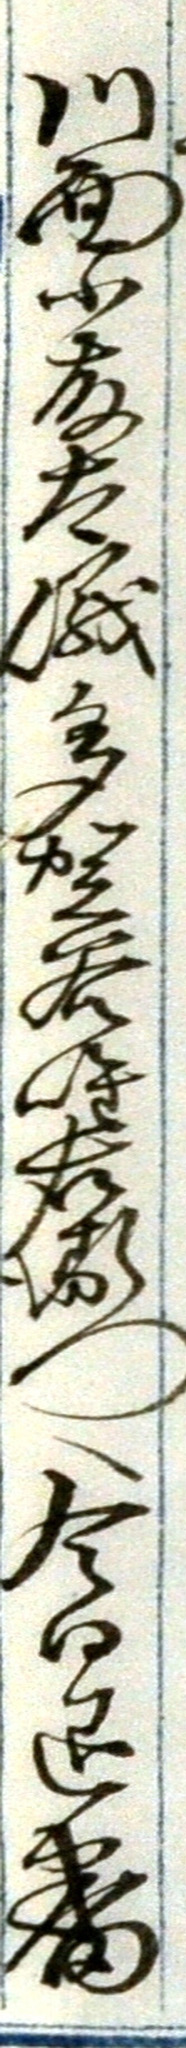川面小藤太儀多賀谷唯右衛門へ今日退番

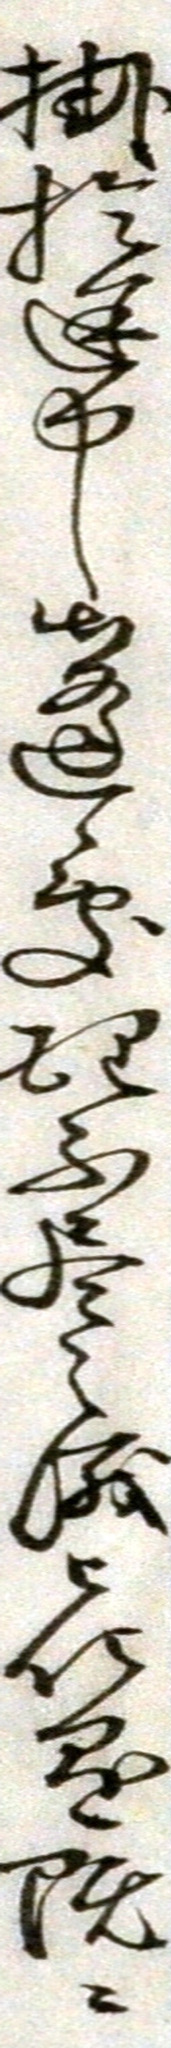掛於途中出逢候處理不尽之儀被仕懸既ニ
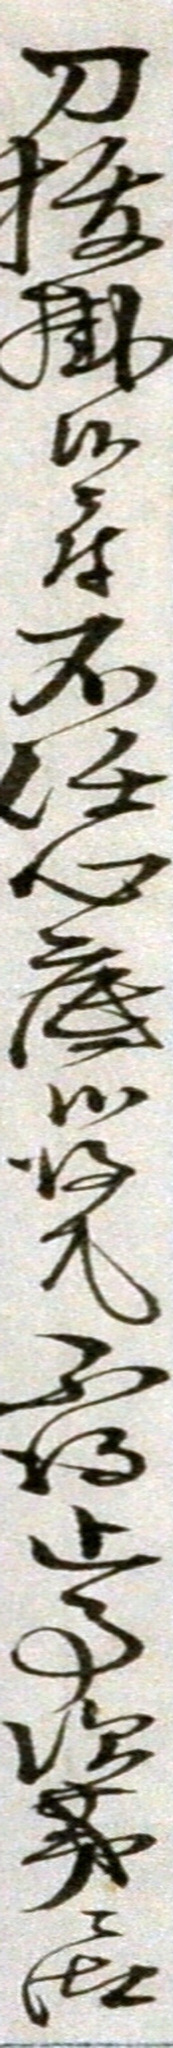刀抜掛候ニ付不任心底候得共不得止事次第ニ御
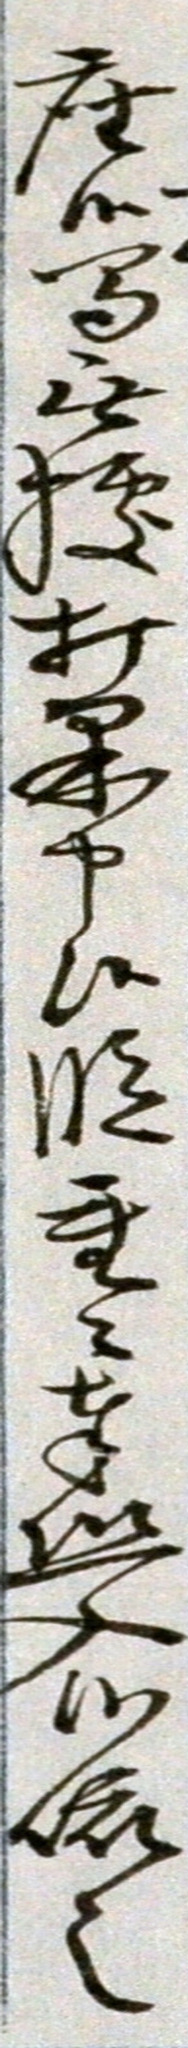座候間無拠討果申候段重々奉恐入候依之
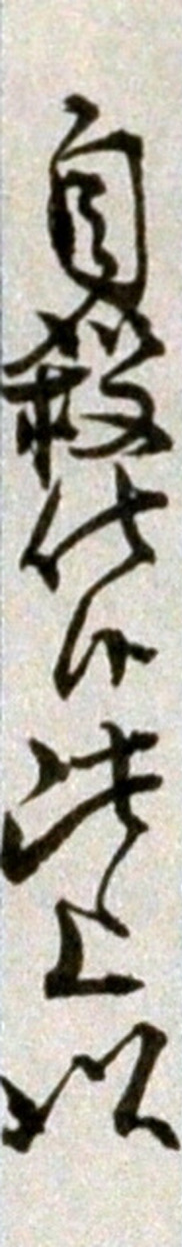自殺仕候此上以
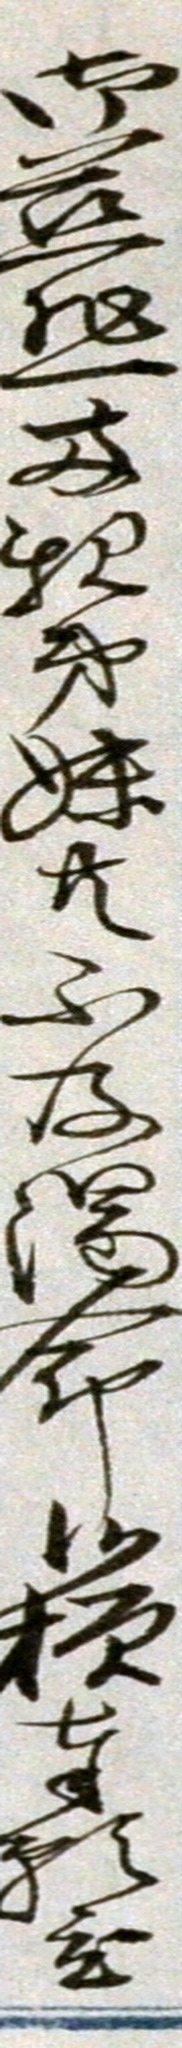御慈悲両親弟妹共不及渇命候様奉願度
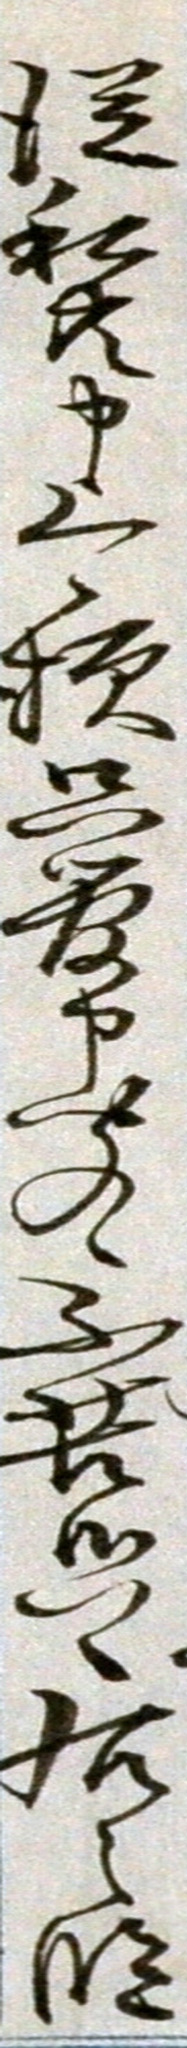従私共申上候様只管申聞候不苦候ハヽ右之段
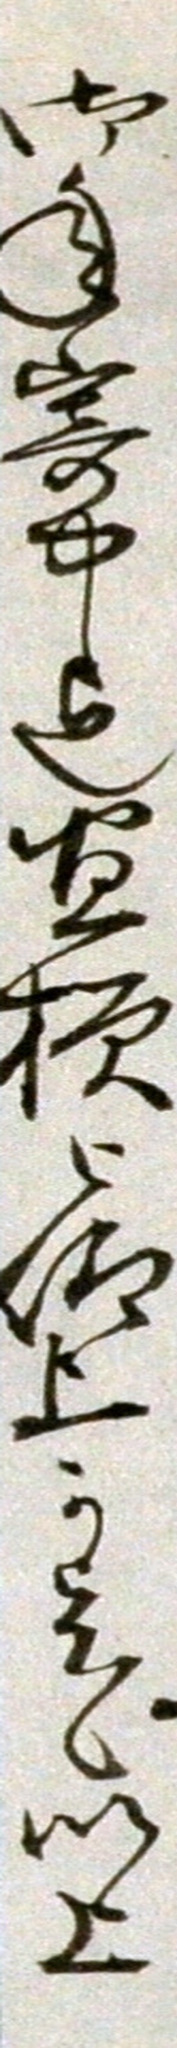御年寄中迄宜様被仰上可被下候以上
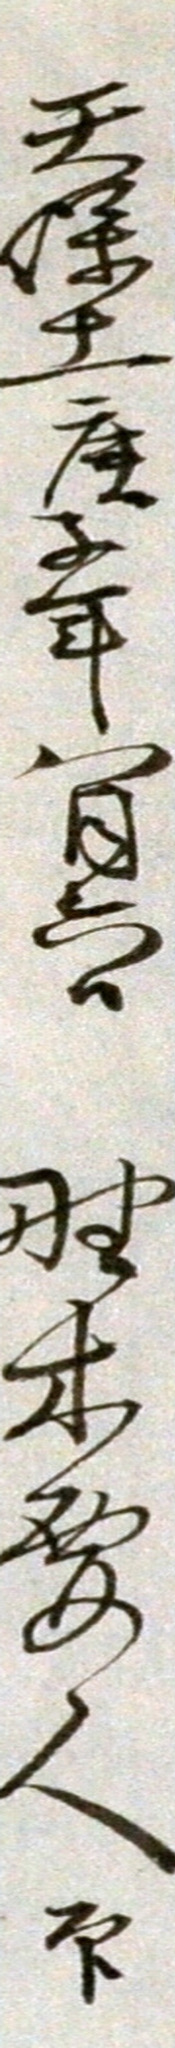天保十一庚子年八月六日野木要人印
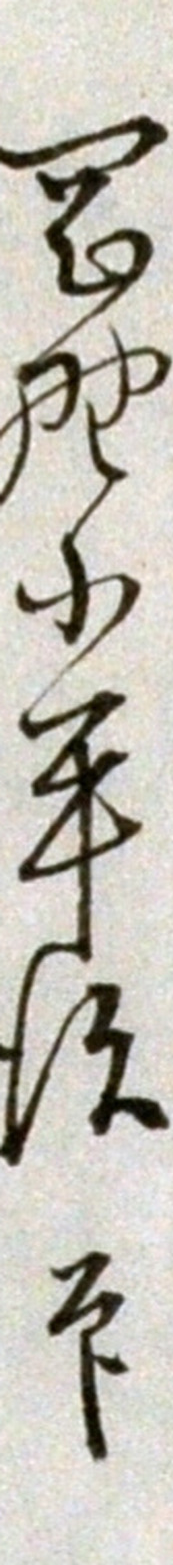岡野小平治印
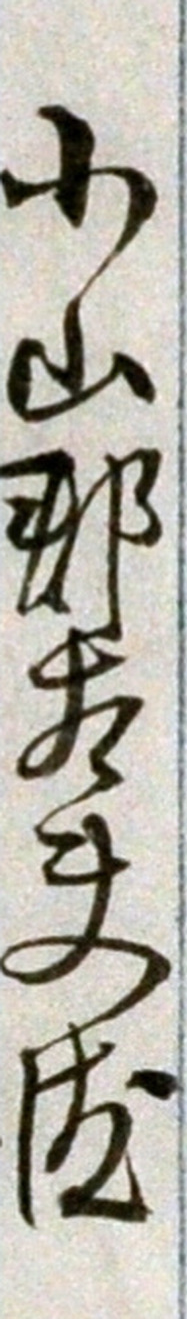小山郡太夫殿
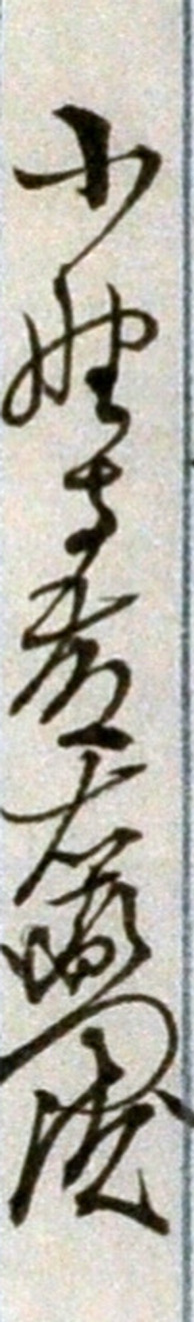小野寺藤右衛門殿
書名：川面小藤太子細有之多賀谷唯右衛門ヲ打果候一件
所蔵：伊那市立高遠町図書館・合同会社AMANE
